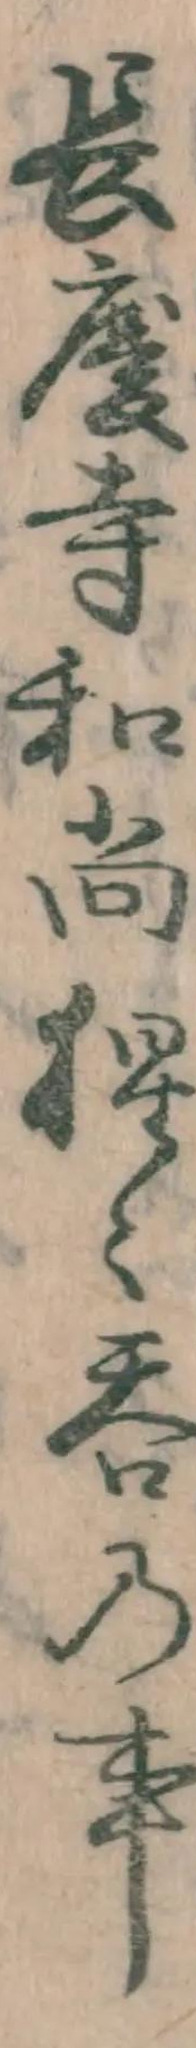長慶寺和尚猩々呑の事
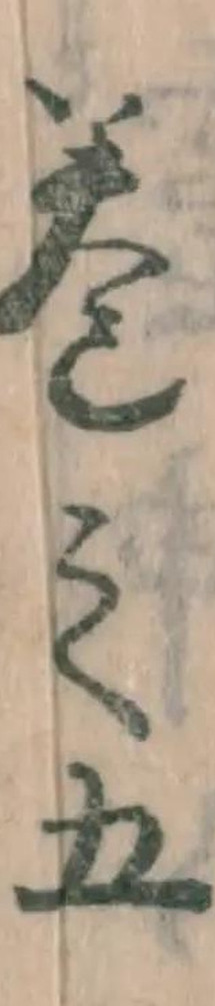巻の五
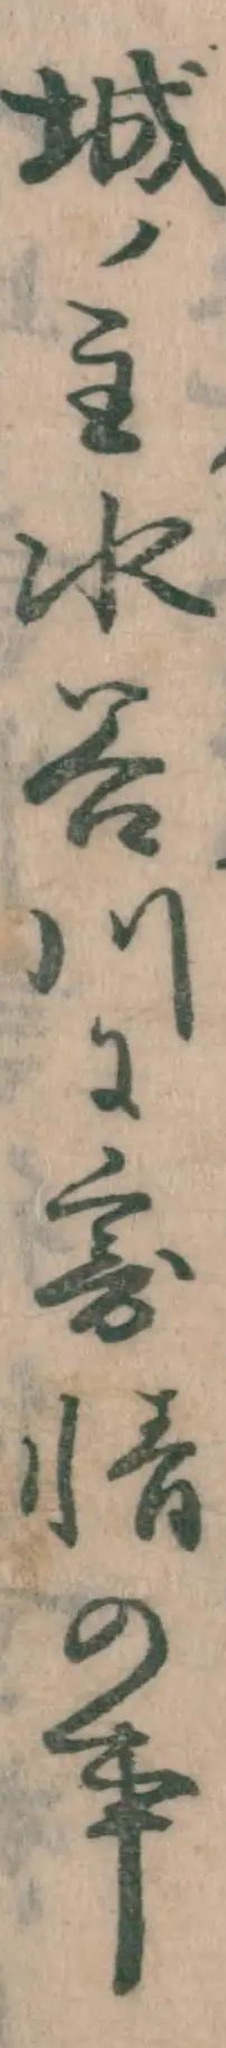城の主水谷川に寄情の事
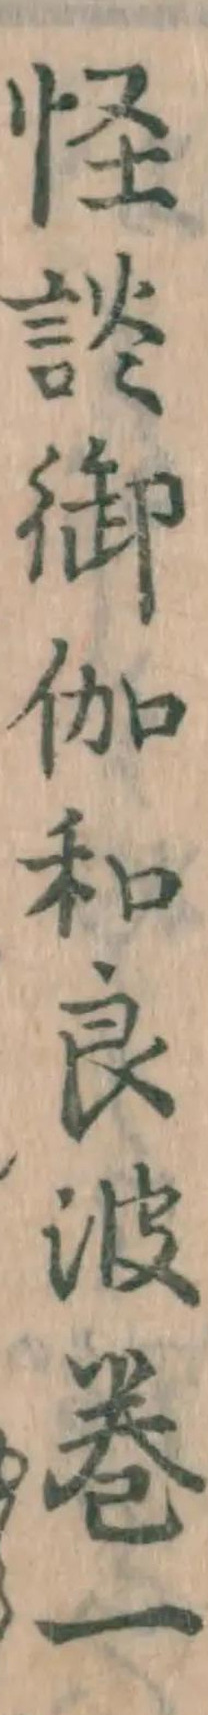怪談御伽和良波巻一
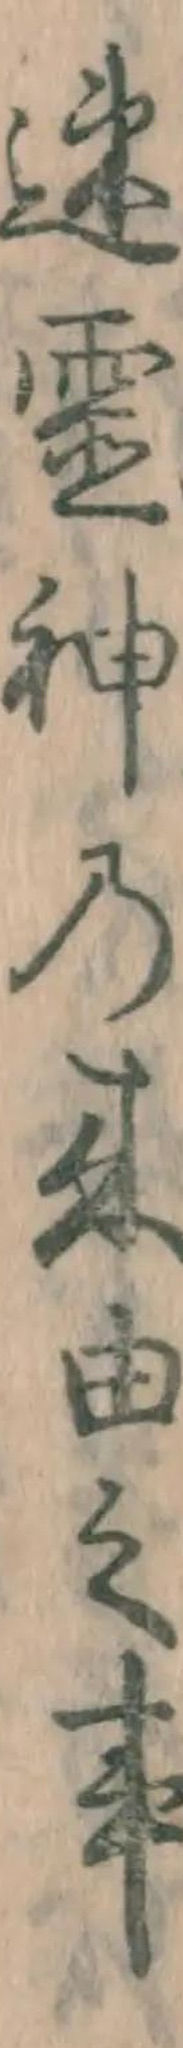速霊神の由来之事
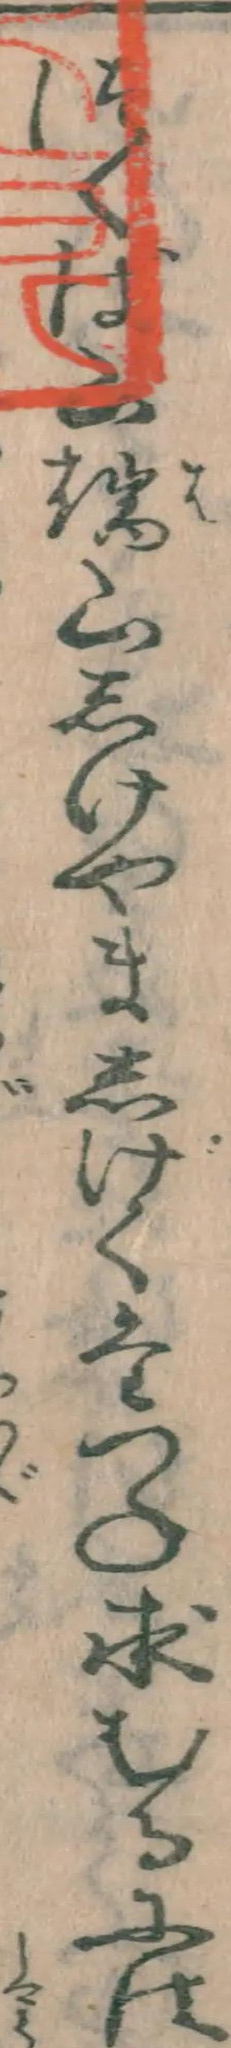つくば山端山しけやましけくたつね求むるには
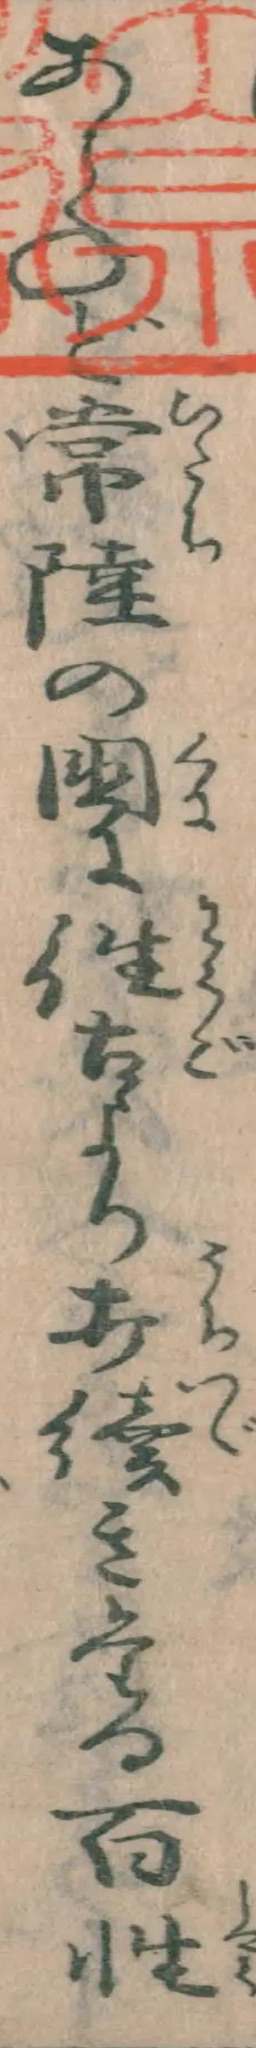あらねど常陸の国に往古より打続きたる百姓
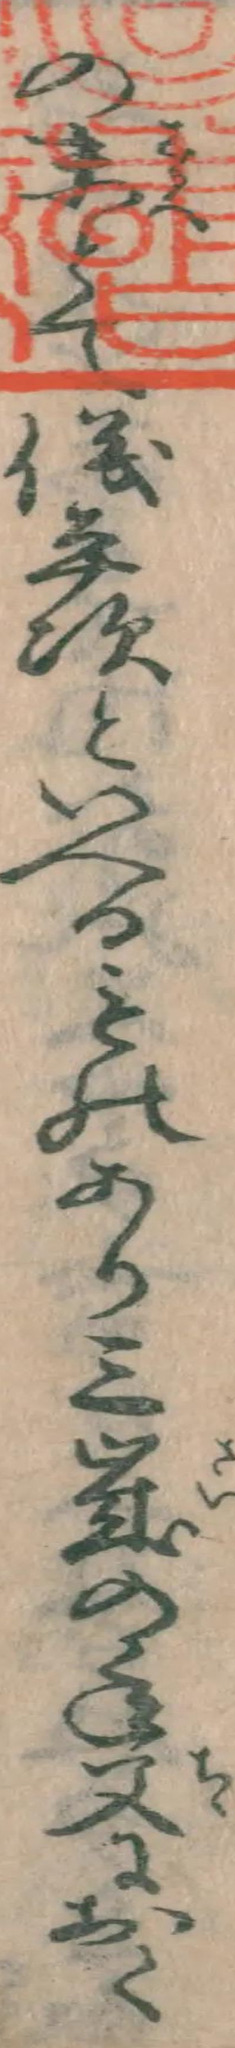の末とて儀兵次といへるものあり三歳の年父におく
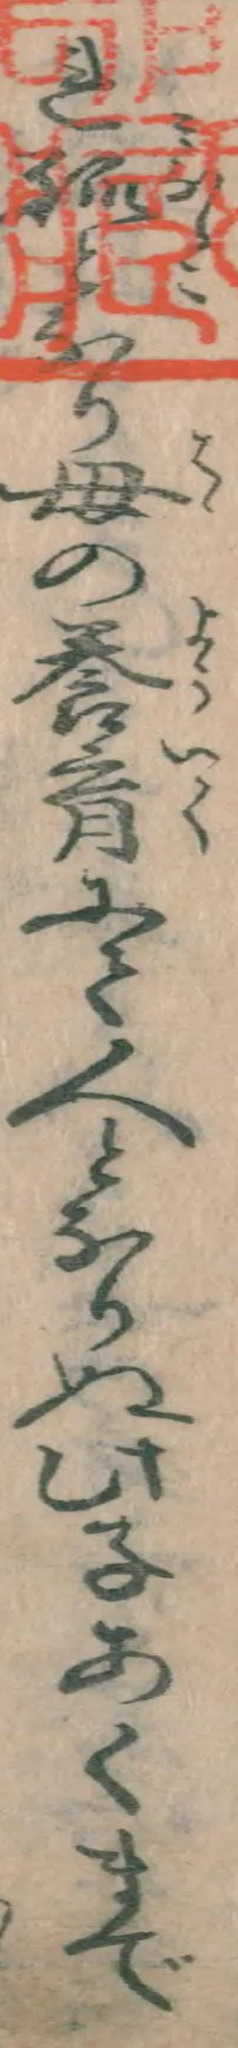れ孤となり母の養育にて人となりぬ此子あくまで
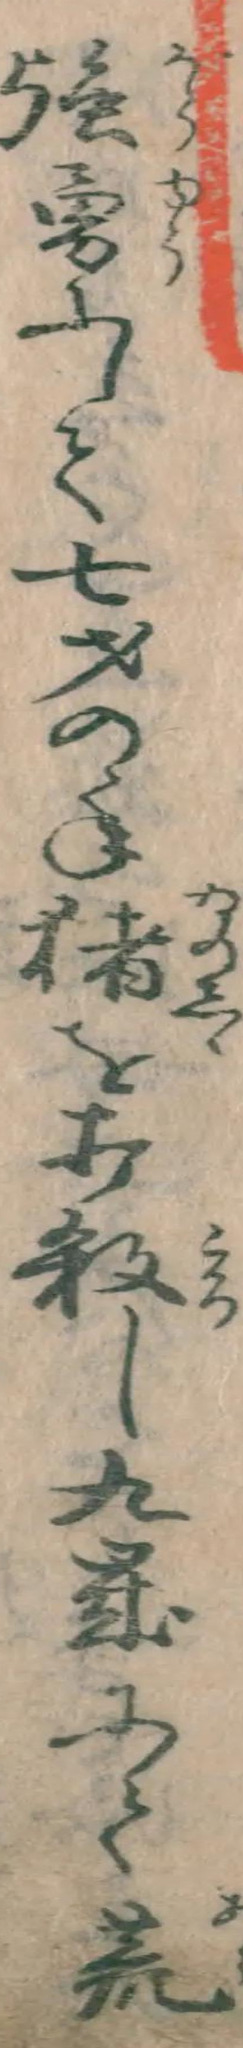強勇にて七才の年猪を打殺し九歳にて荒
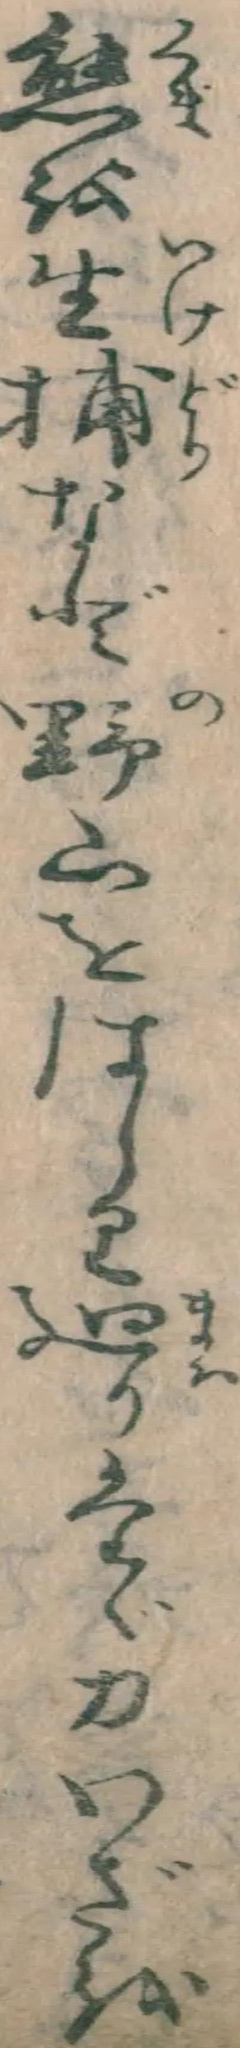熊を生捕など野山をはしり廻りたゞ力わざを
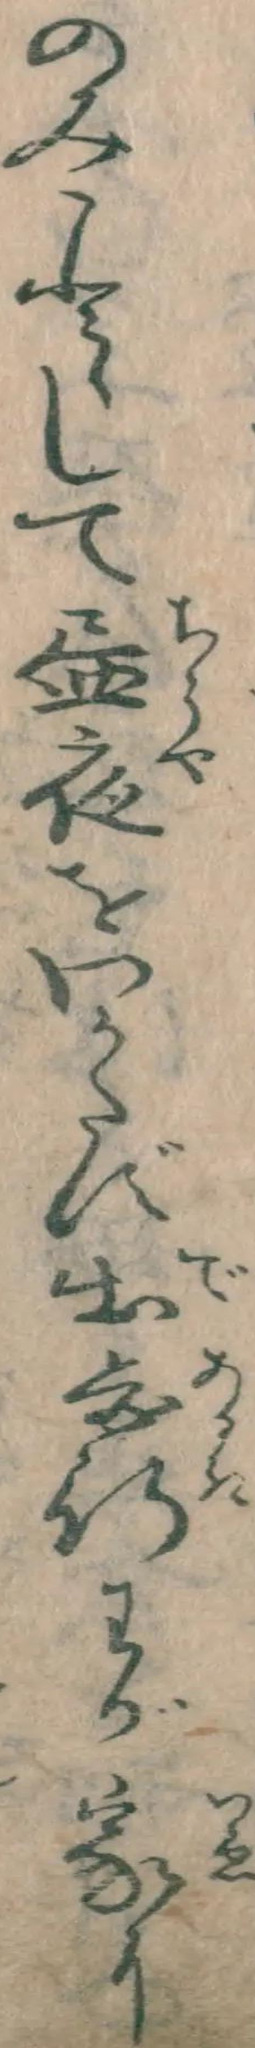のみことゝして注やをわかたず出歩行わが家に
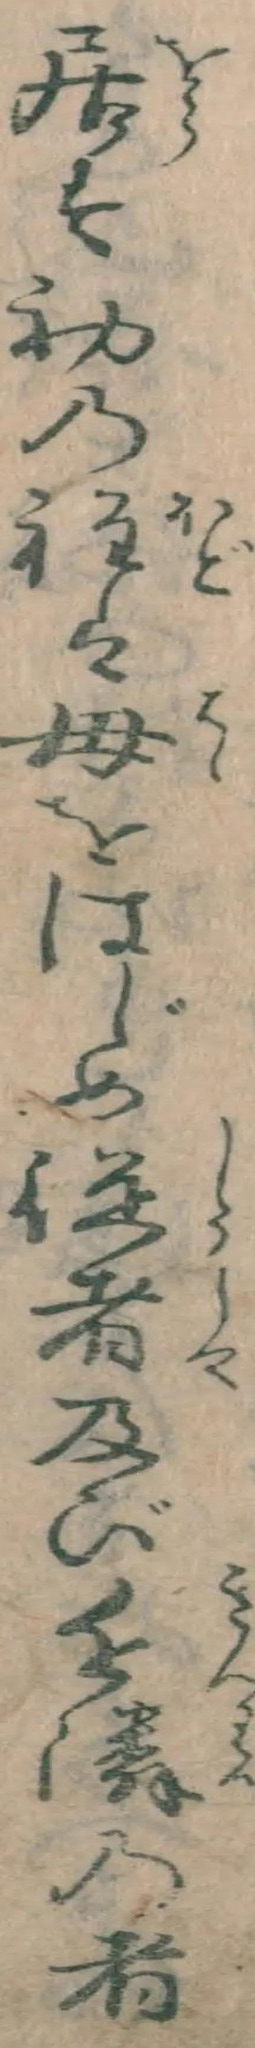居す初の程は母をはじめ従者及び近隣の者

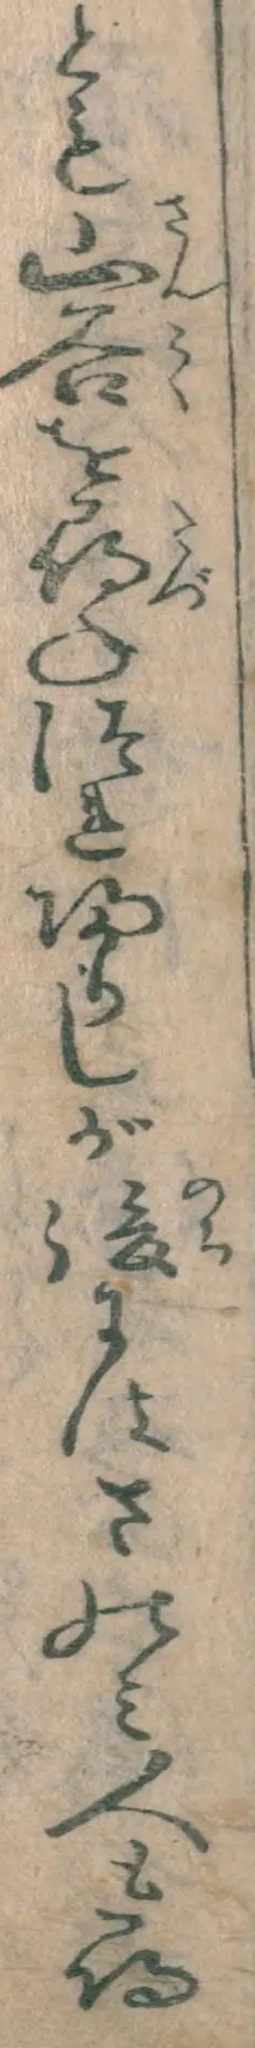とも山谷を訪ねつれ帰りしが後にはさのみ人も尋
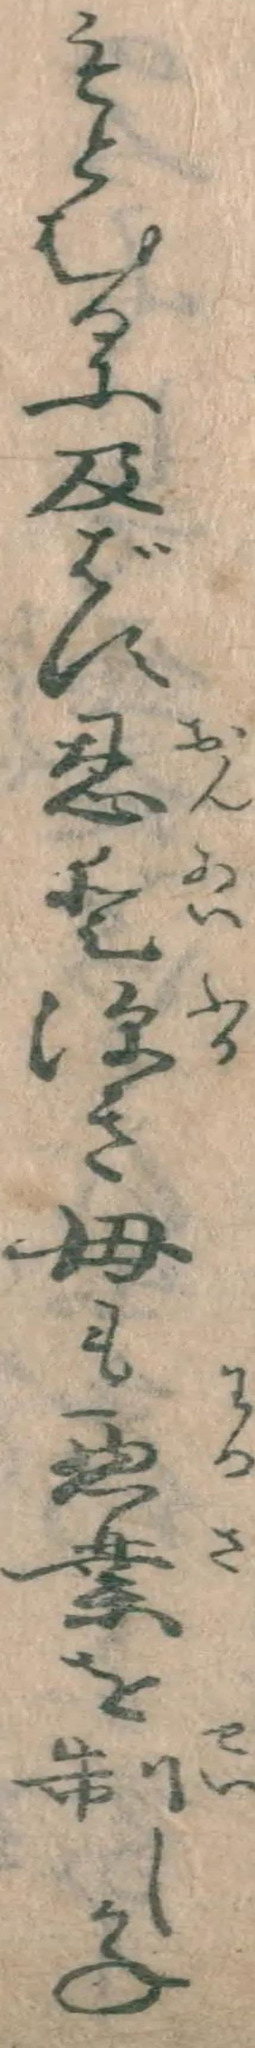もとむるに及ばす恩愛深き母も悪業を制しかね
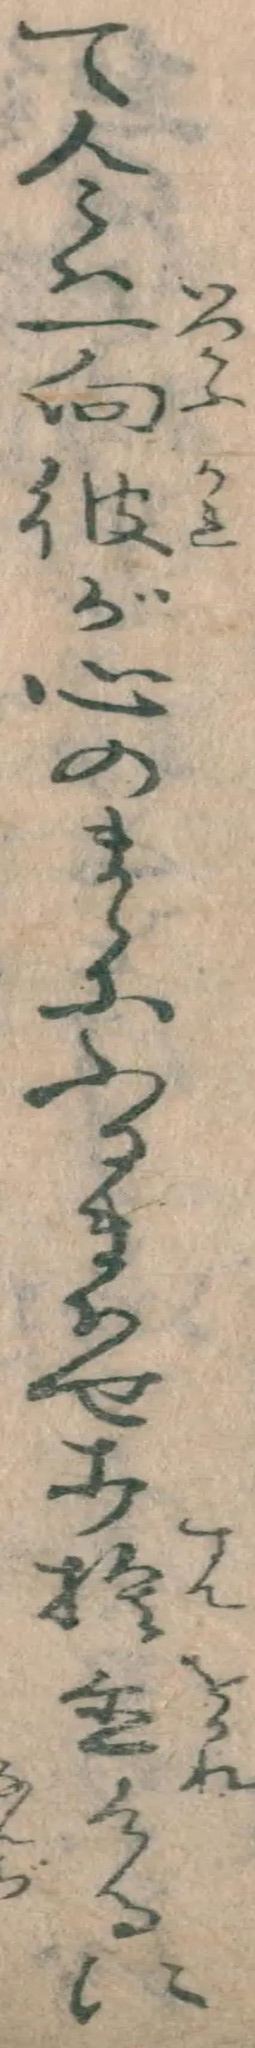て今は一向彼が心のまゝにふるまはせ打捨置けるに
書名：怪談御伽童 5巻. [1]
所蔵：国立国会図書館 National Diet Library, JAPAN
